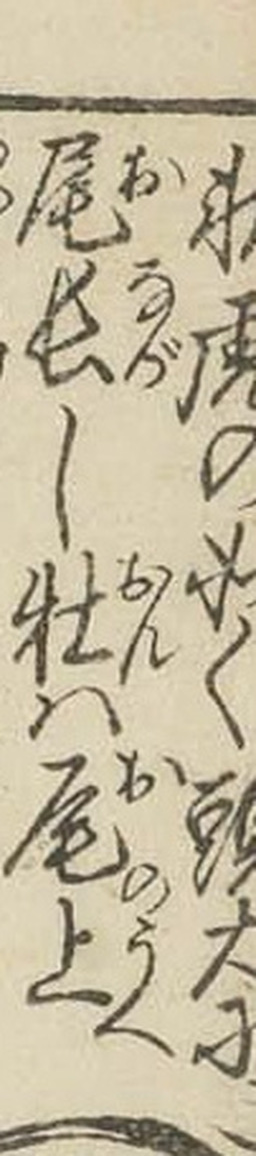尾長し牡は尾上
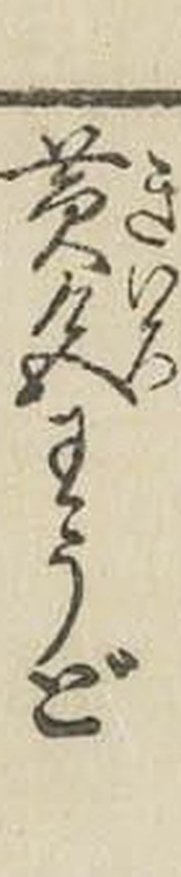黄色わうど
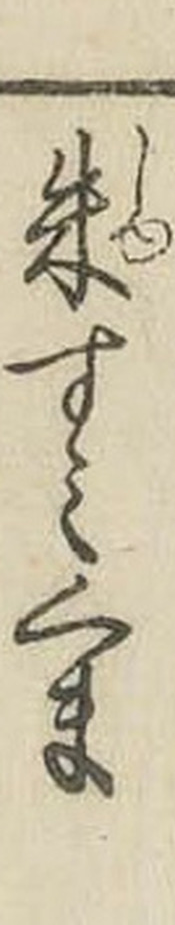朱すみくま
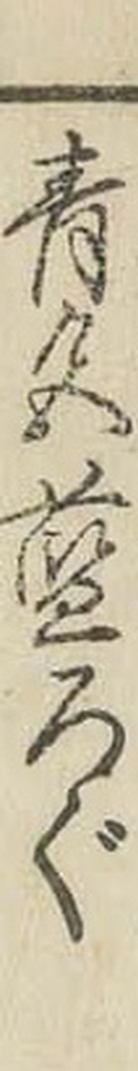青色藍ろぐ
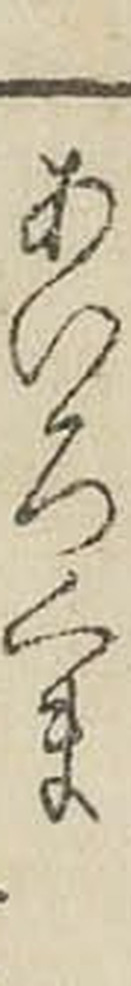あいろくま
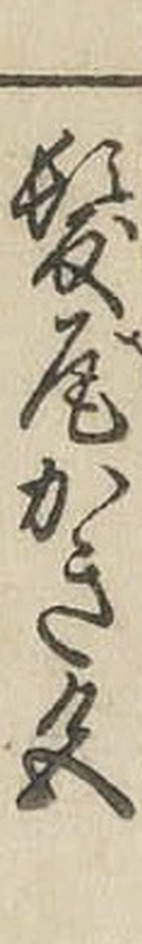髪尾かき色
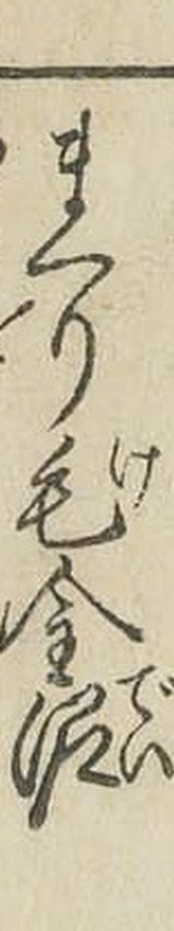まくり毛金泥

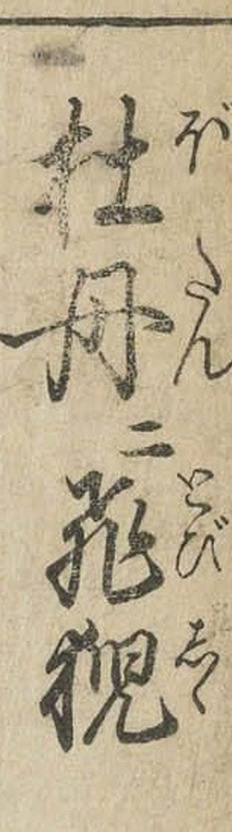牡丹に飛猊

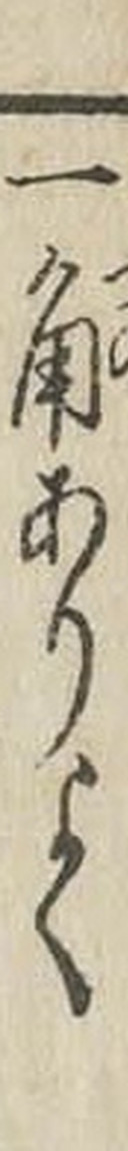一角ありよく
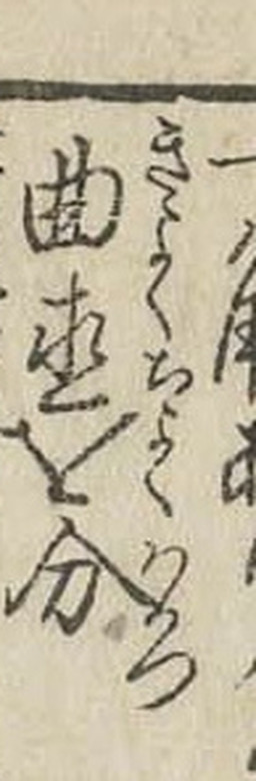曲直を分
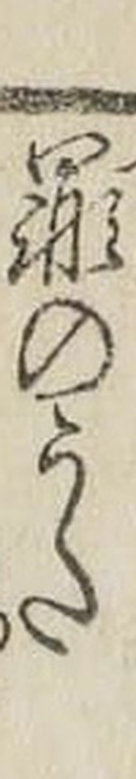罪のうた
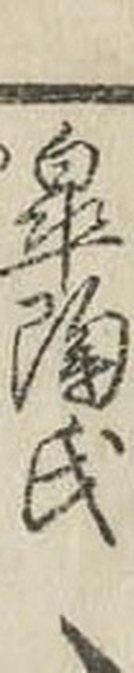皐陶氏
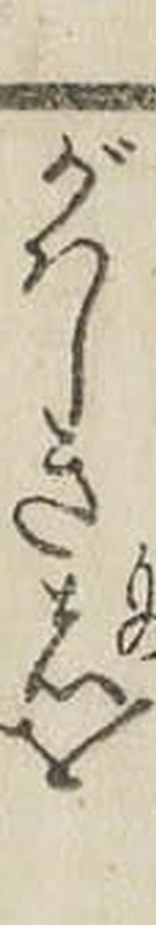がはしき者を
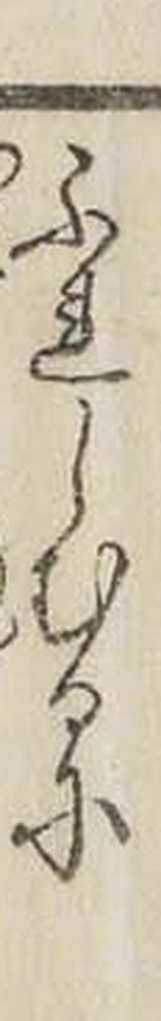ふれしむるに
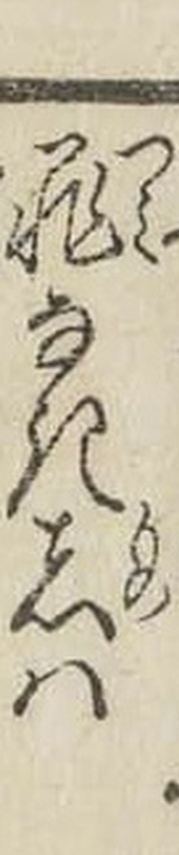罪なき者は
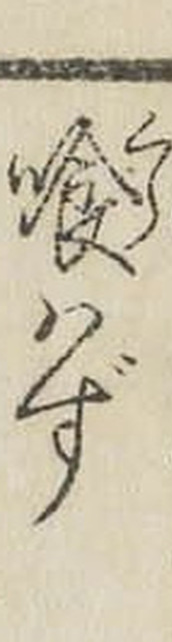喰はず
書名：絵本写宝袋 9巻 9之巻上
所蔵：東京学芸大学教育コンテンツアーカイブ
